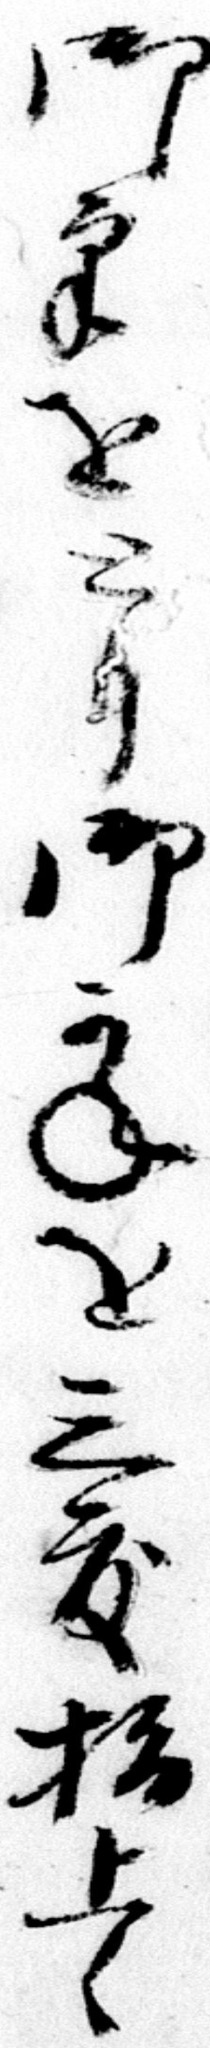御筆をとり御かねを三度指上候
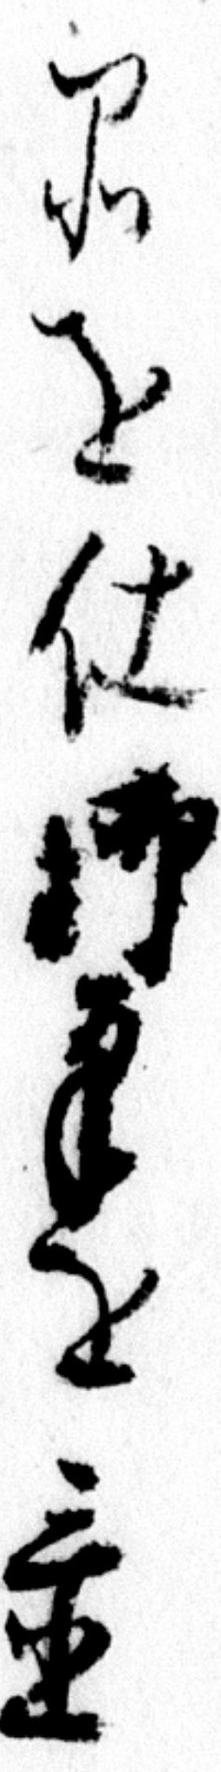品を仕御筆を置
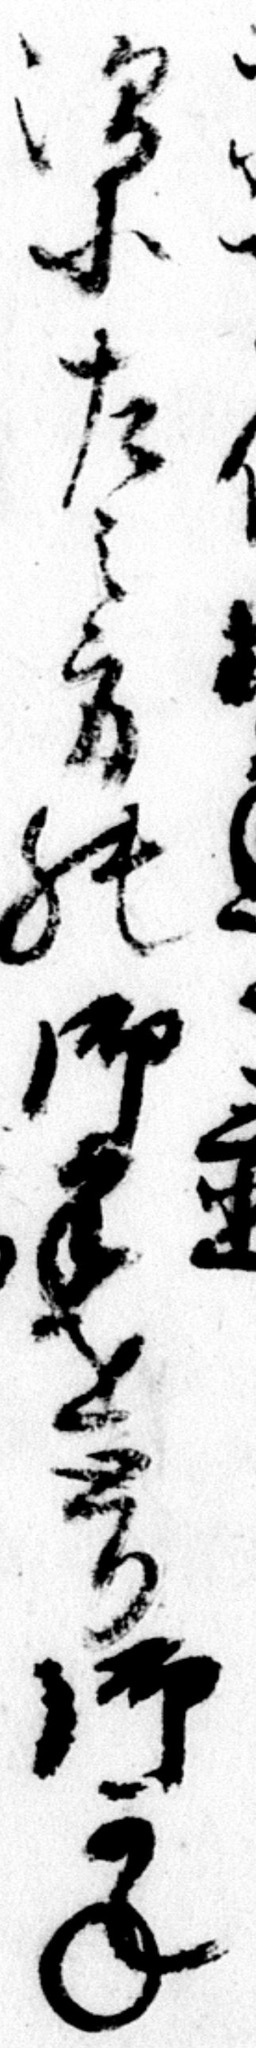次に左之方の御筆をとり御かね
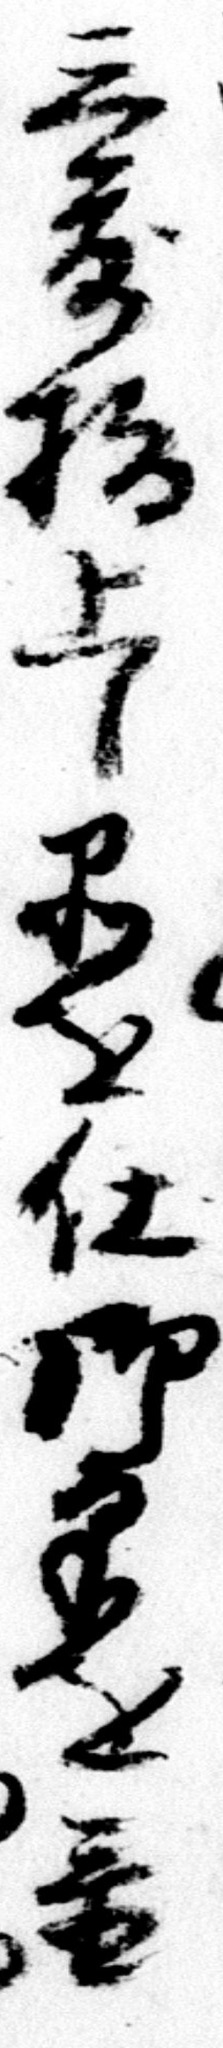三度指上候品を仕御筆を置
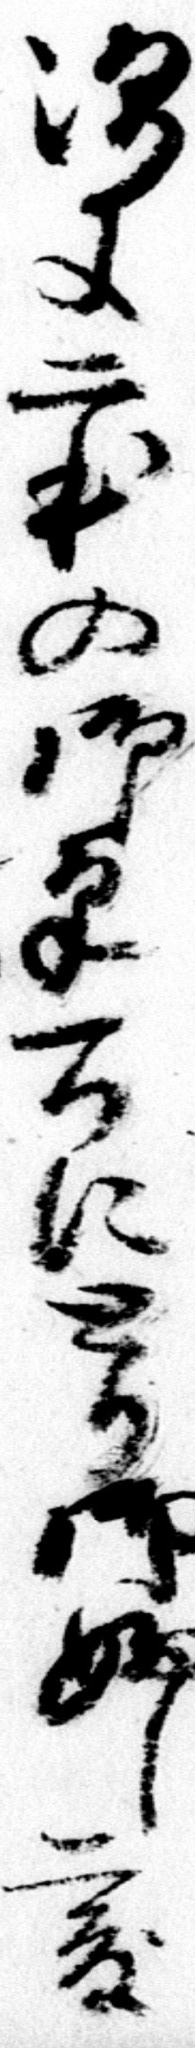次に二本の御筆一つにとり御ふし二度
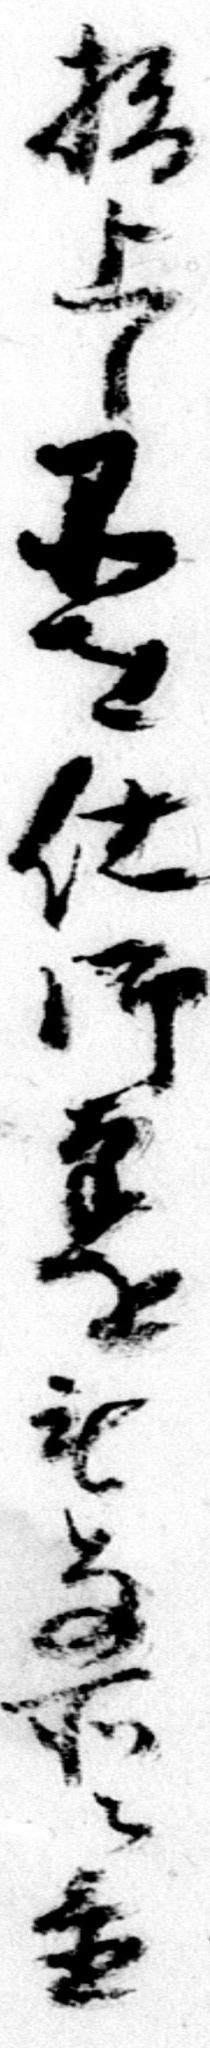指上候品を仕御筆をもとの所ニ置
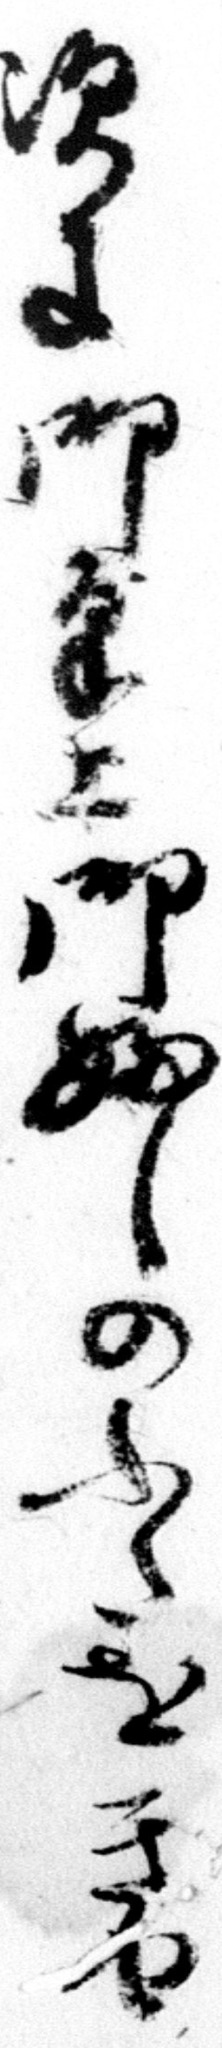次に御筆上御ふしのふたをきせ
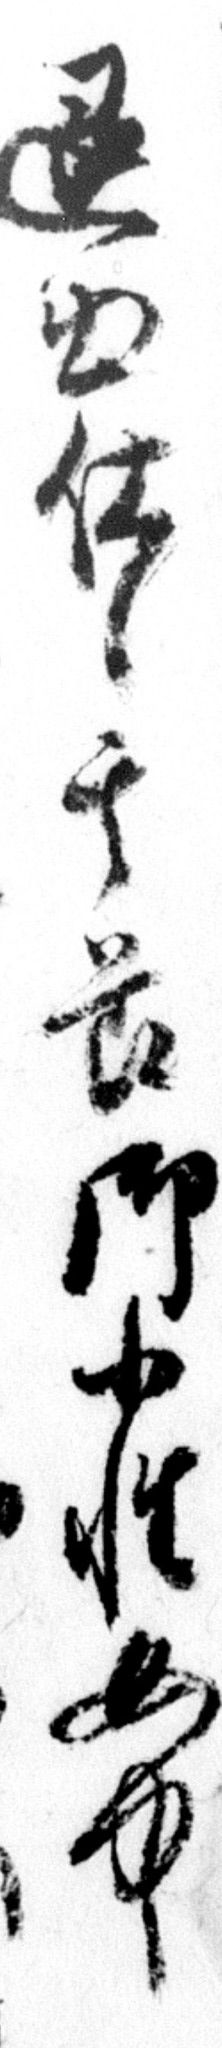退出仕候其節御小性女中
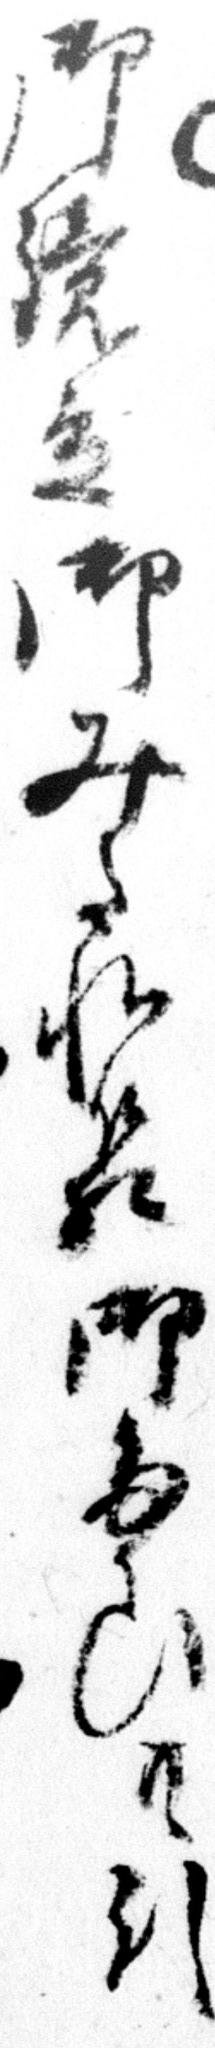御鏡立御みたれ箱御たらひ共引
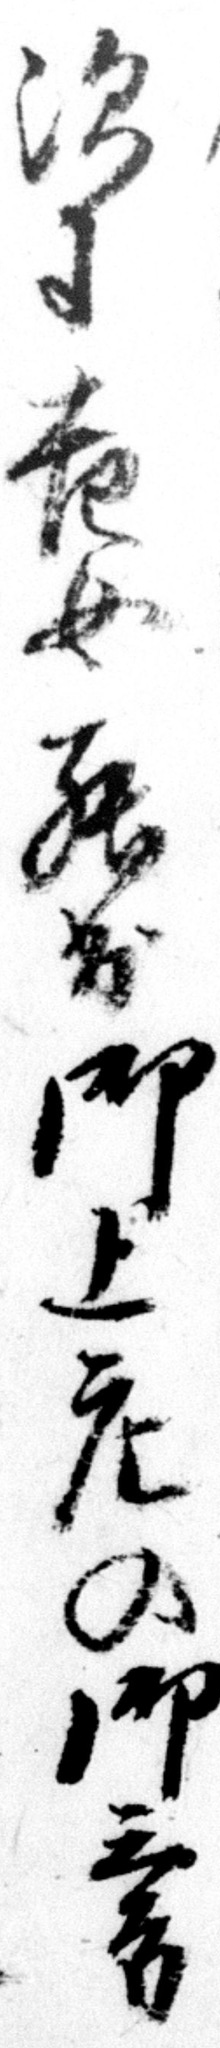次に老女罷出御上座の御三方
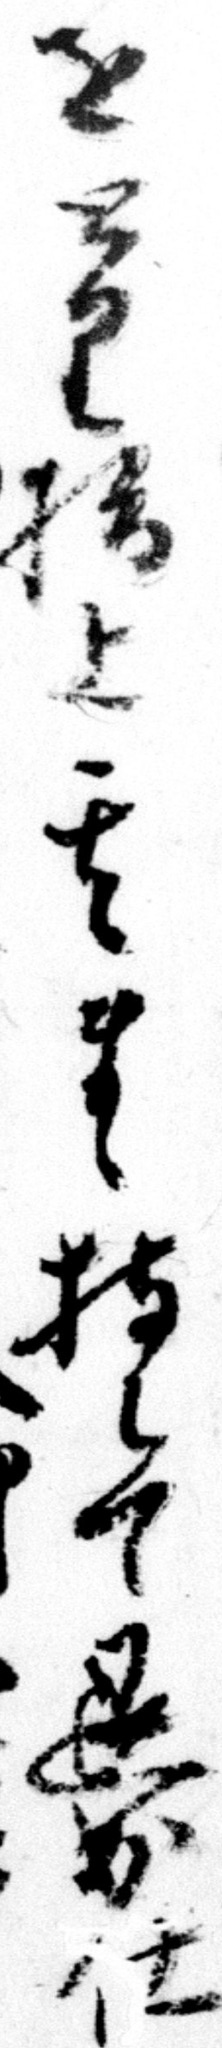をとり指上其まゝ持して退出仕
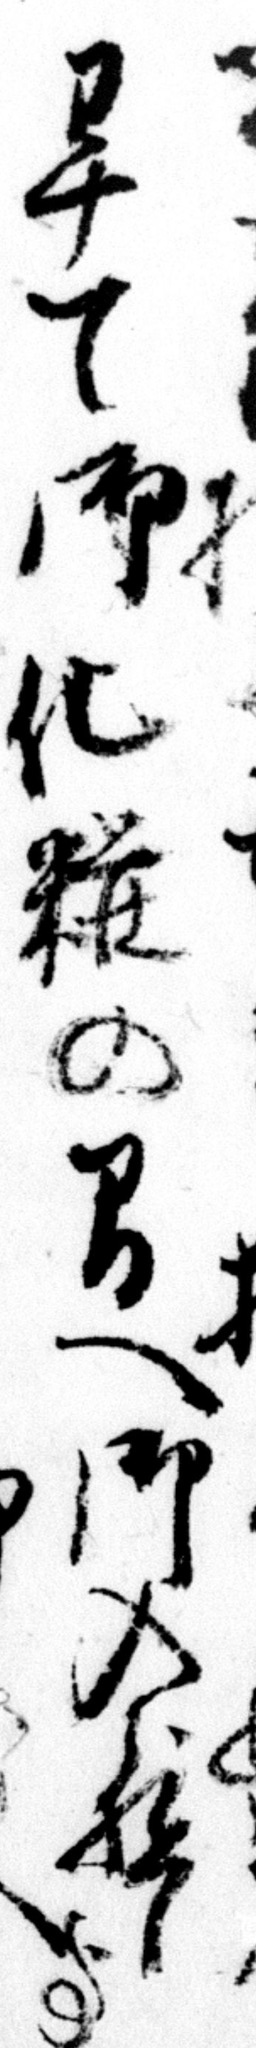畢て御化粧の間へ御入被遊候事
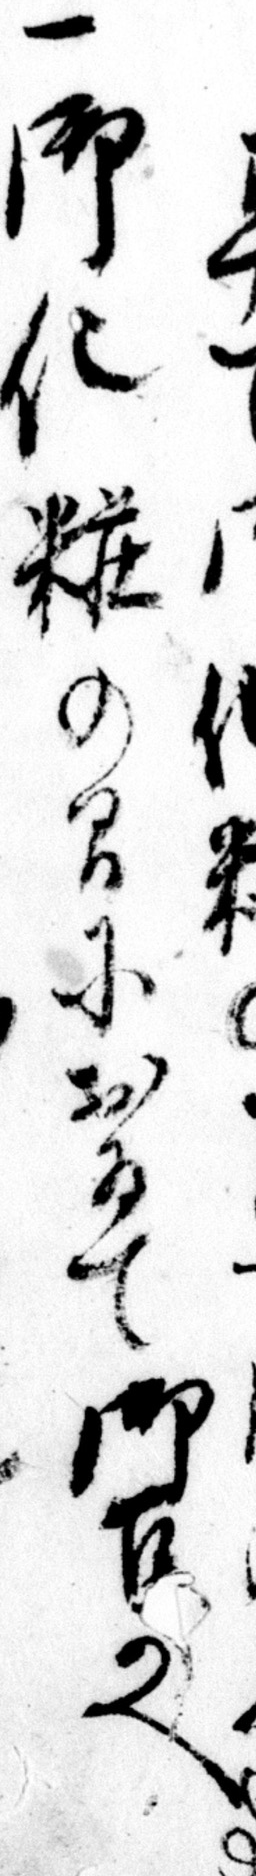一御化粧の間におゐて御召かへ
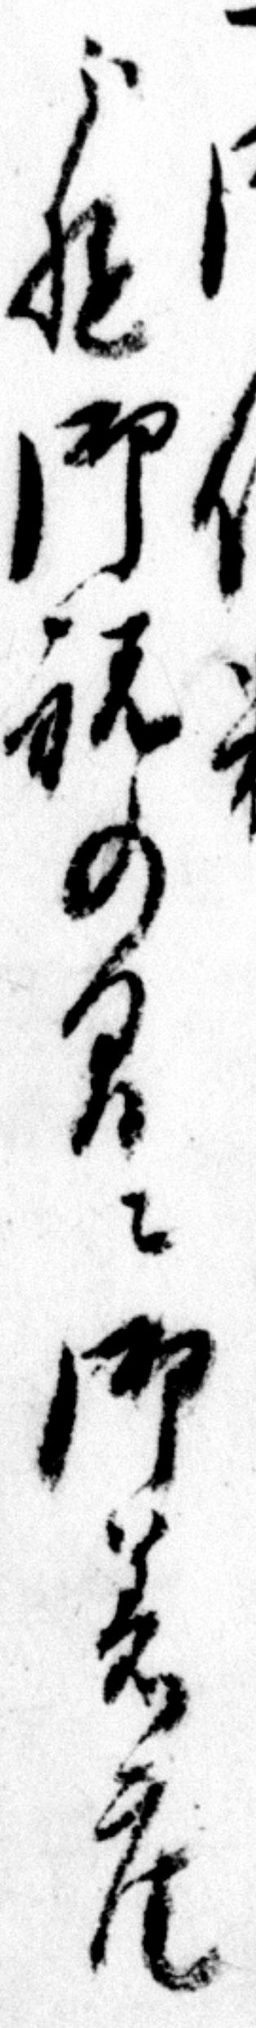被遊御祝の間ニ御着座

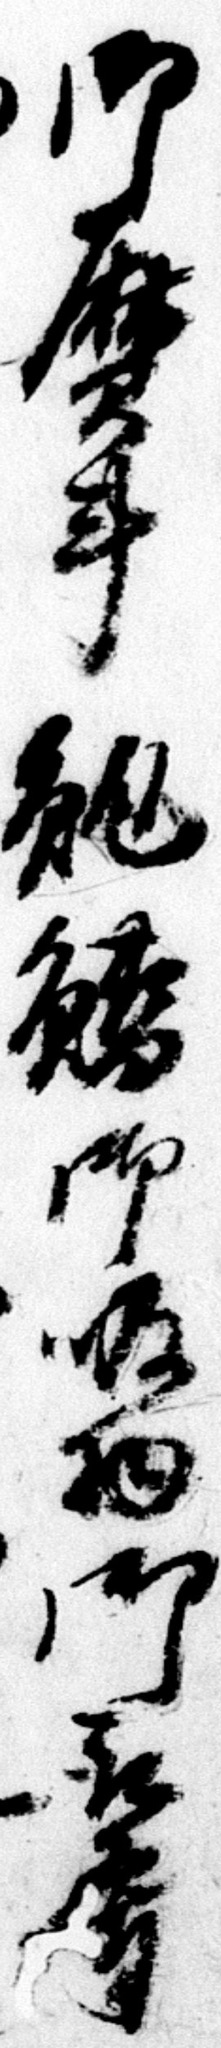御熨斗鮑鰭御吸物御取肴
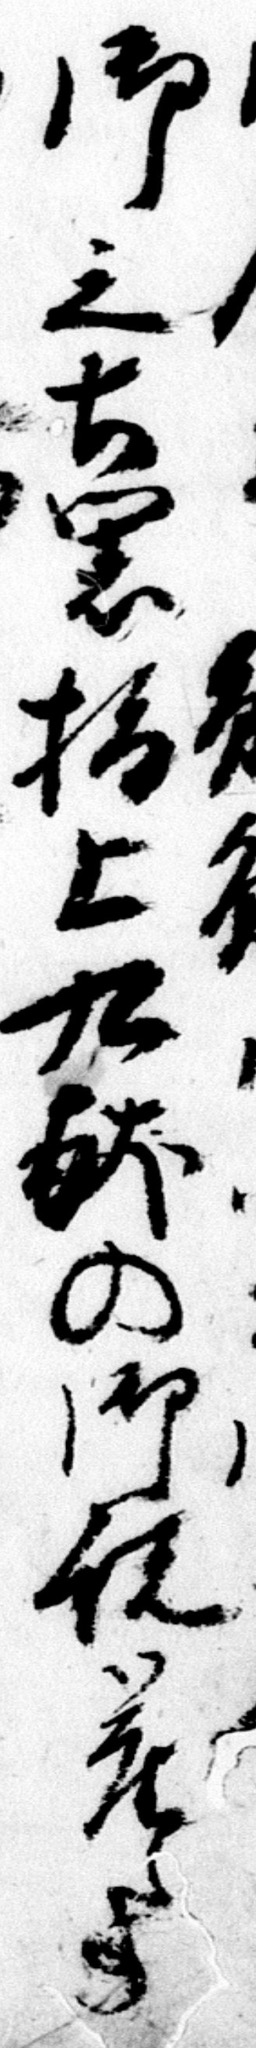御三古器指上九献の御祝御座候事
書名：光姫様御かねはじめ御式
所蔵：徳島県立図書館
